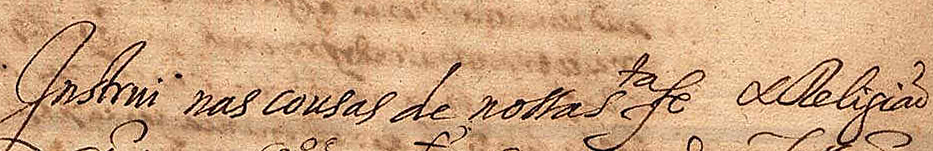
Jnstrui nas cousas de nossa sta fe & Religiaõ
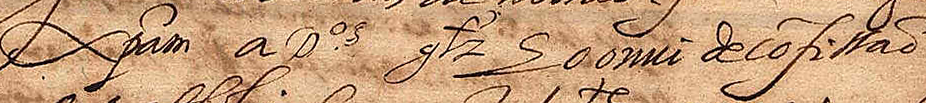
Xpām a D.os gl̄z E o ouui de cōfissaõ
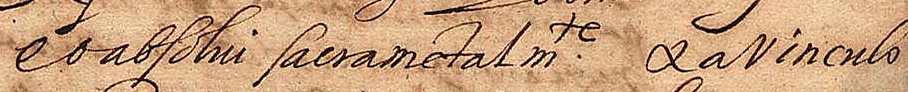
e o absolui sacramētalm.te & a vinculo
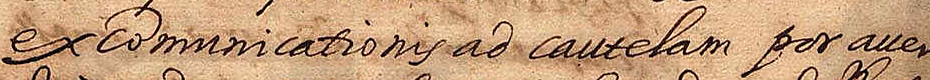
excōmunicationis ad cautelam por auer
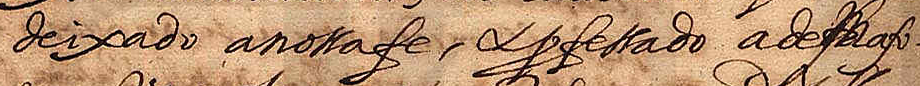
deixado a nossa fe, & ꝓfessado a de Mafo
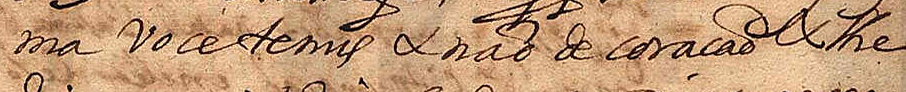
ma voce temis & naõ de coraçaõ & lhe
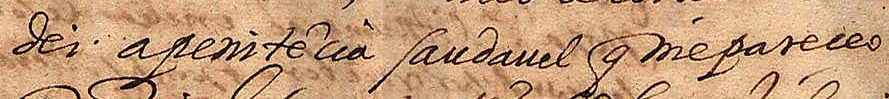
dei a penitēcia saudauel q̄ me pareceo
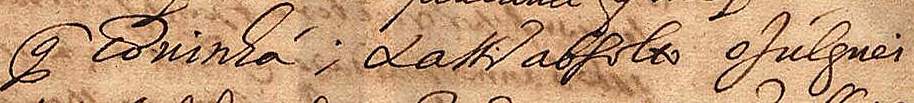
q̄ cōuinha; & assī absolto o Julguei
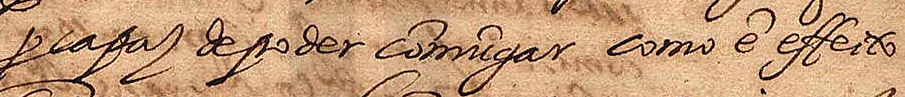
ꝓ capaz de poder cōmūgar como ē effeito
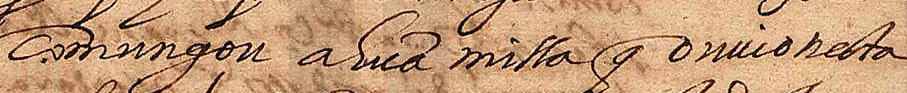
c̄omungou a huā missa q̄ ouuio nesta
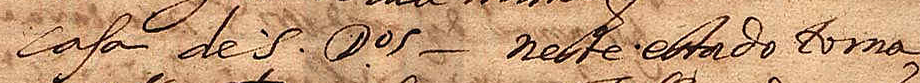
casa de .S. D.os - neste estado torna
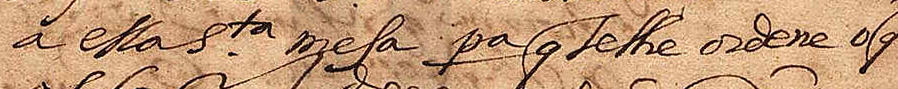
a essa s.ta mesa ꝑa q̄ se lhe ordene o q̄
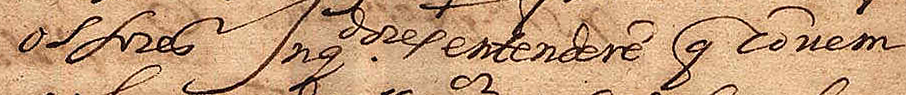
os sores̄ Jnq.dores entenderē q̄ cōuem
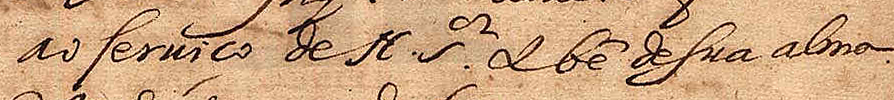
ao seruiço de N. S.or & bē de sua alma
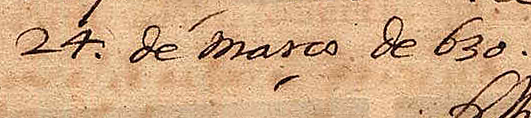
24. de março de 630.
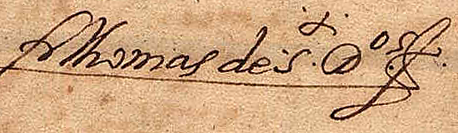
Fr thomas de .S. D.os
